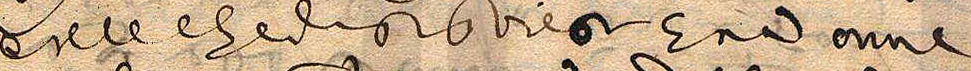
e elle lhe dise q̄ viese E nā ouue
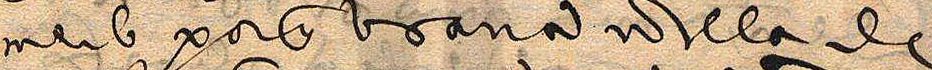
medo porq̄ vsauā cō ella de
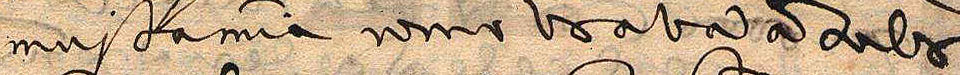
mujta m̄ia como vsavā cō todos
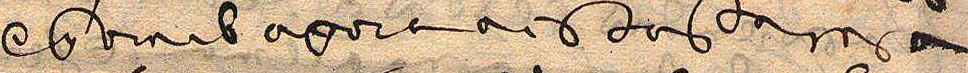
e q̄ vindo agora a esta sta casa
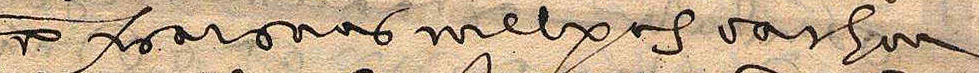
cōfesar suas cullpas o achou
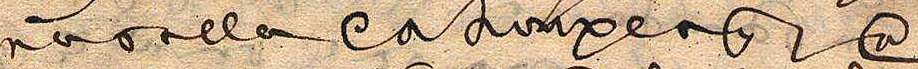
na salla e a trouxe aq̄j ā
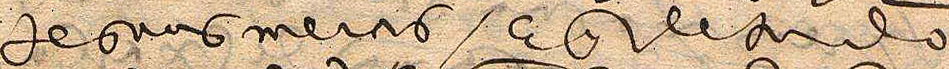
te suas merçes / E q̄ de tudo
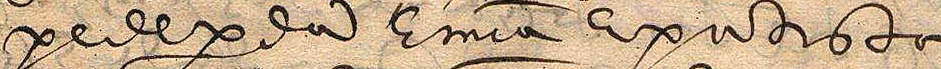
pede ꝑdā E m̄ia E protesta
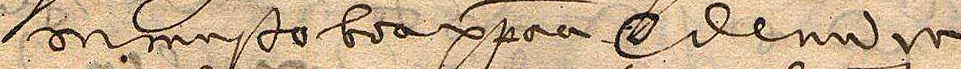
ser mujto boa x̄paa e de nūca
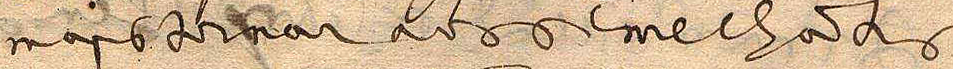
majs tornar aos semelhātes
